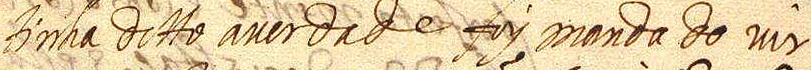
tinha ditto a uerdade foy mandado uir
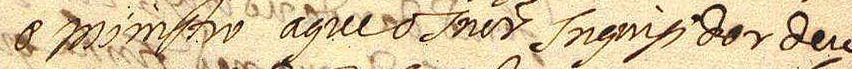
o ministro a que o snor̄ Jnquisidor deu
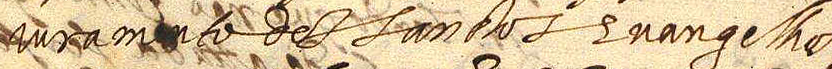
iuramento dos sanctos Euangelhos
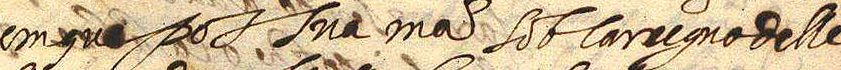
em que pos sua maõ sob careego delle
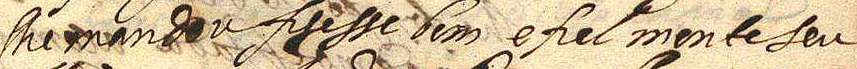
lhe mandou fisesse bem e fielmente seu
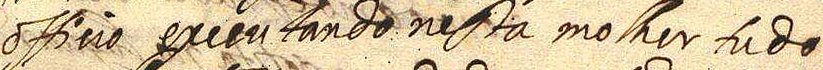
officio executando nesta molher tudo
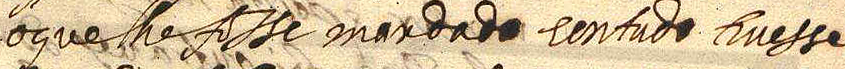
o que lhe fosse mandado E en tudo tiuesse
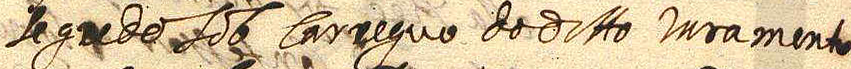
segredo sob carrego do ditto Iuramento
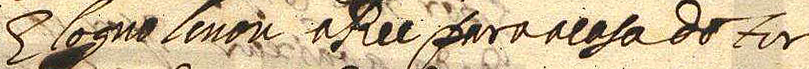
E loguo leuou a Ree para a casa do tor
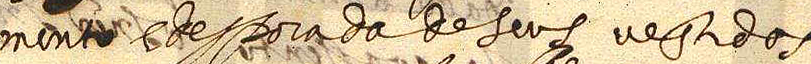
mento e despoiada de seus uestidos
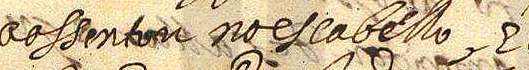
a assentou no escabello, E
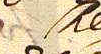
lhe
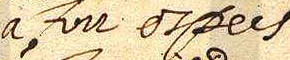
atou os pees
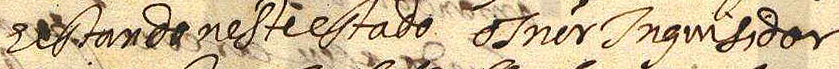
E estando neste estado o snōr Inquisidor
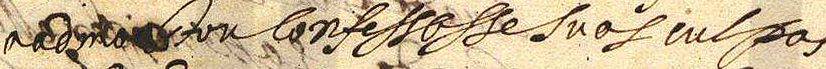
a admo_stou confessasse suas culpas
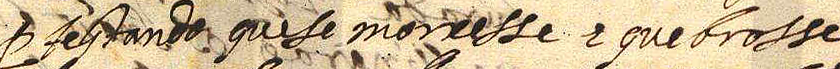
ꝓtestando que se morresse E quebrasse
